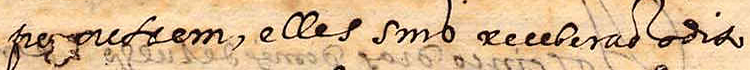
per outrem, e elles snrs̄ receberaõ o dito
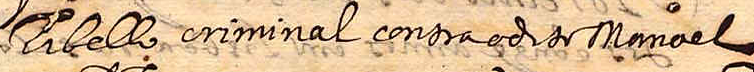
libello criminal contra o dito Manoel
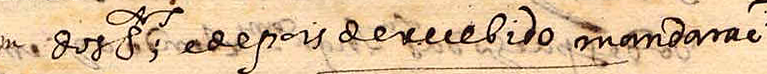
dos Stos, e depois de recebido mandaraē
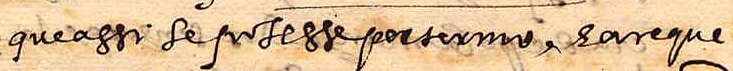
que assi se posesse por termo, e a reque
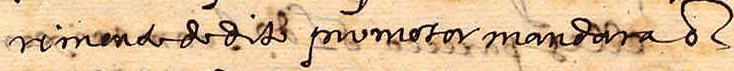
rimento do dito promotor mandaraõ
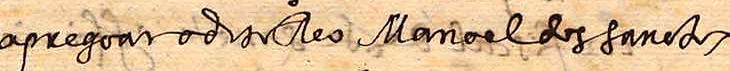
apregoar o dito Reo Manoel dos Sanctos
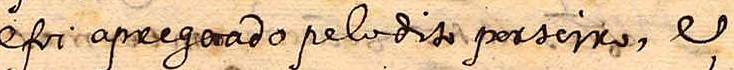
e foi apregoado pelo dito porteiro, e
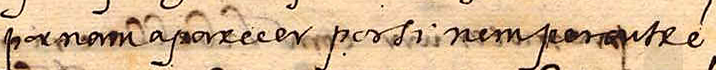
por nom aparecer por si nem por outrē
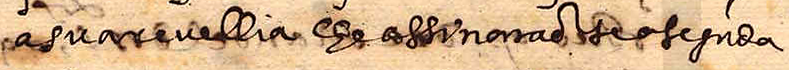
a sua reuellia lhe assinaraõ se a segūda
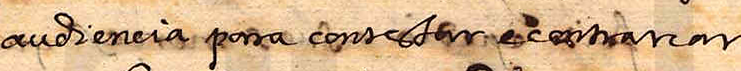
audiencia para contestar e contrariar
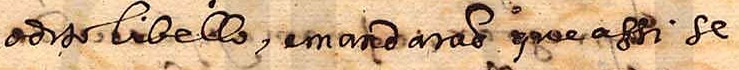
o dito libello, e mandaraõ que assi se
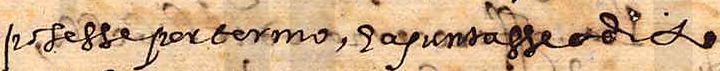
posesse por termo, E ajuntasse o dito
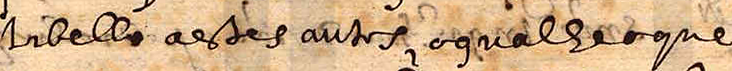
Libello a estes autos, o qual he o que
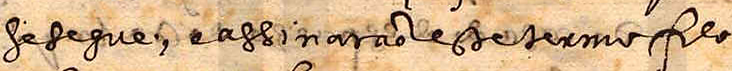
se segue, e assinaraõ este termo frco
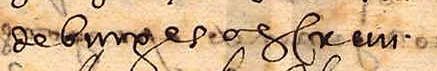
de burges o screvi.
